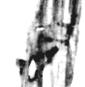吉
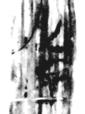南
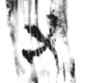又
